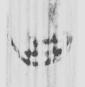曰
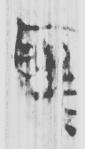聖=
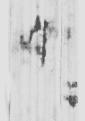人=
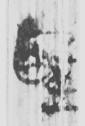聖
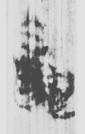聰
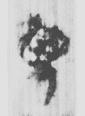{目人}
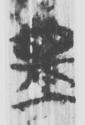盟
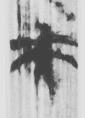夫
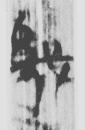幾
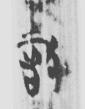信
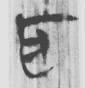耳
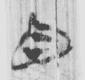目
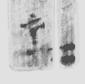十二
